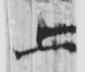上
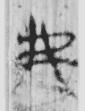弗
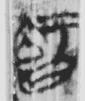智
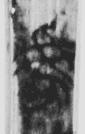唬
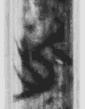此
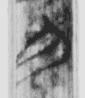勿
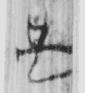也
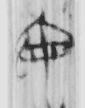{宀母}
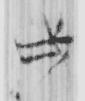𭟮
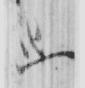之
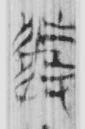{歮十廾}
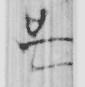也
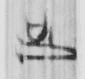足
